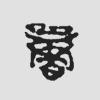單
